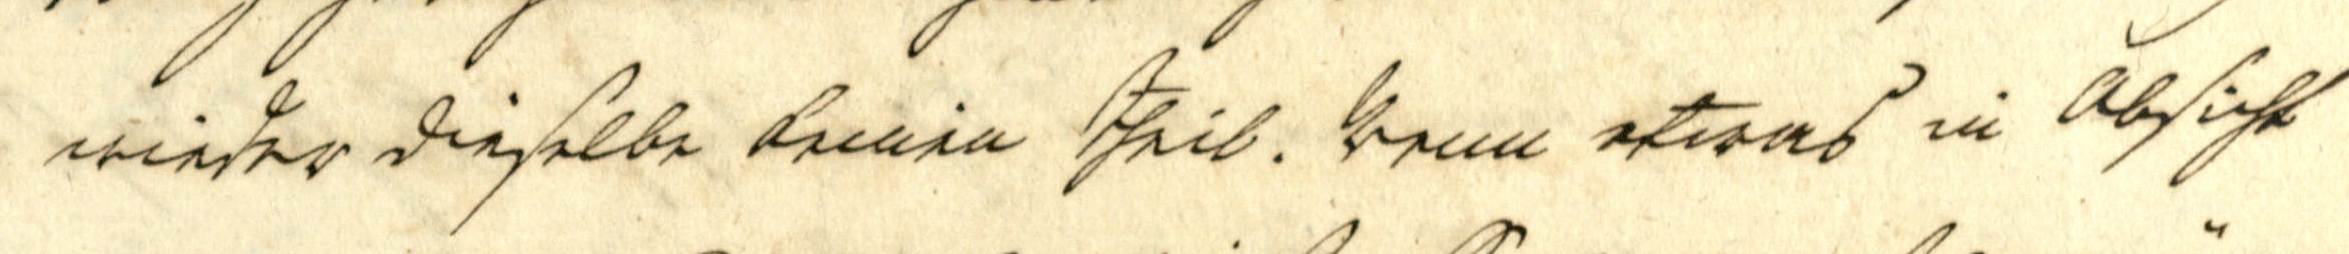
wieder dieselbe keinen Theil. Wenn etwas in Absicht
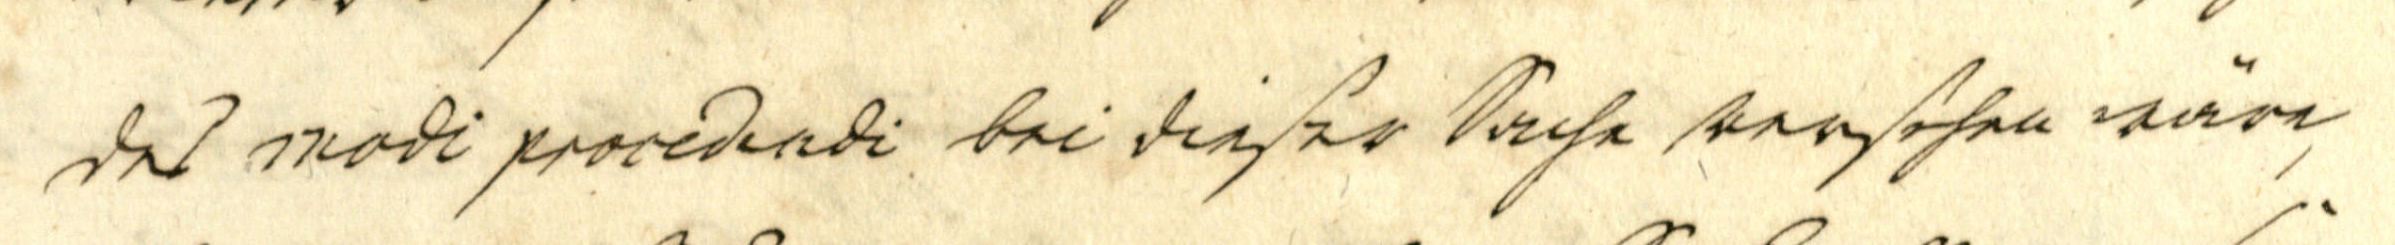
des modi procedendi bei dieser Sache versehen wäre
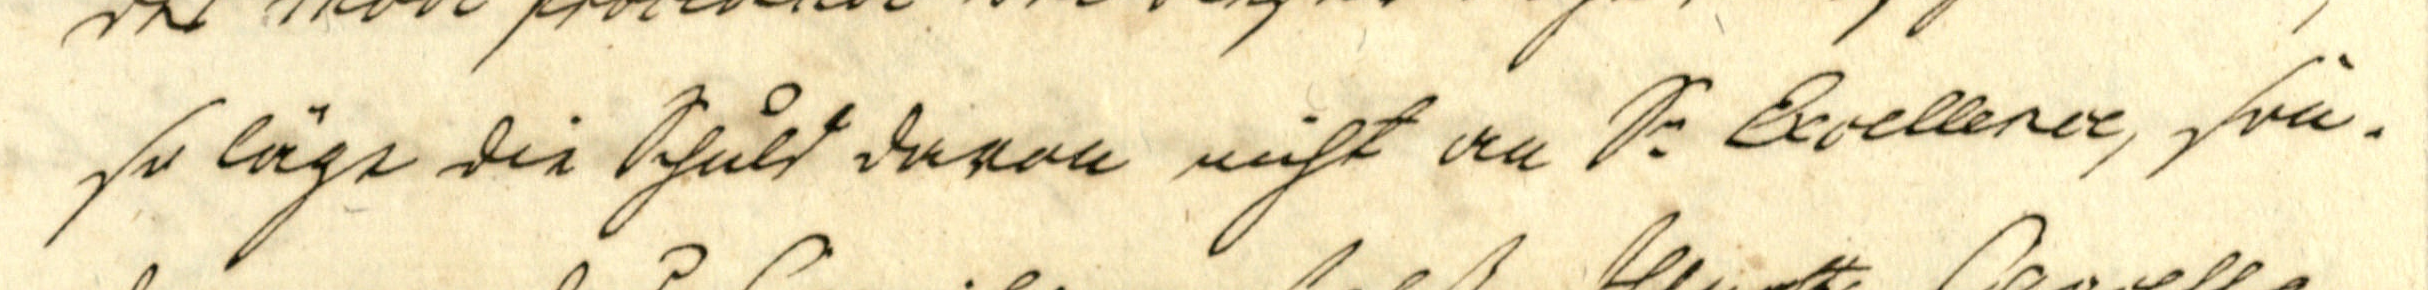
so läge die Schuld davon nicht an Sr. Excellence, son¬
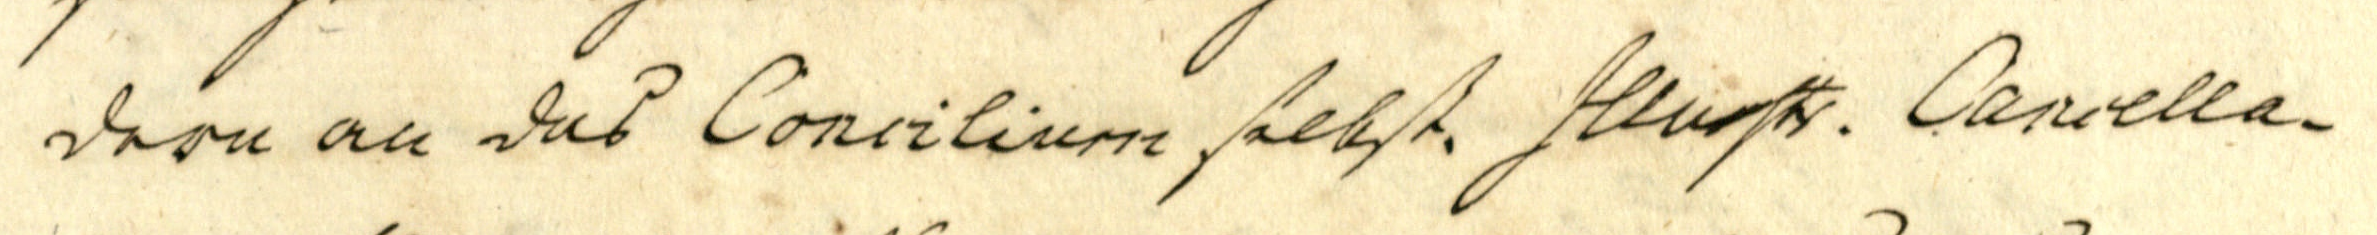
dern an das Concilium selbst. Illust. Cancella¬
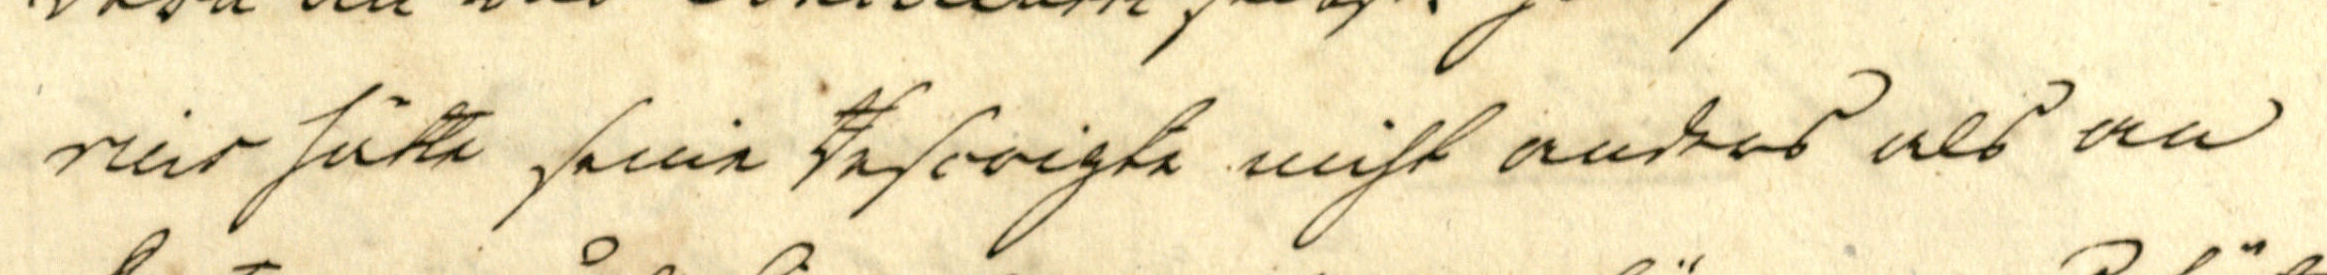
rius hätte seine Rescripte nicht anders als an
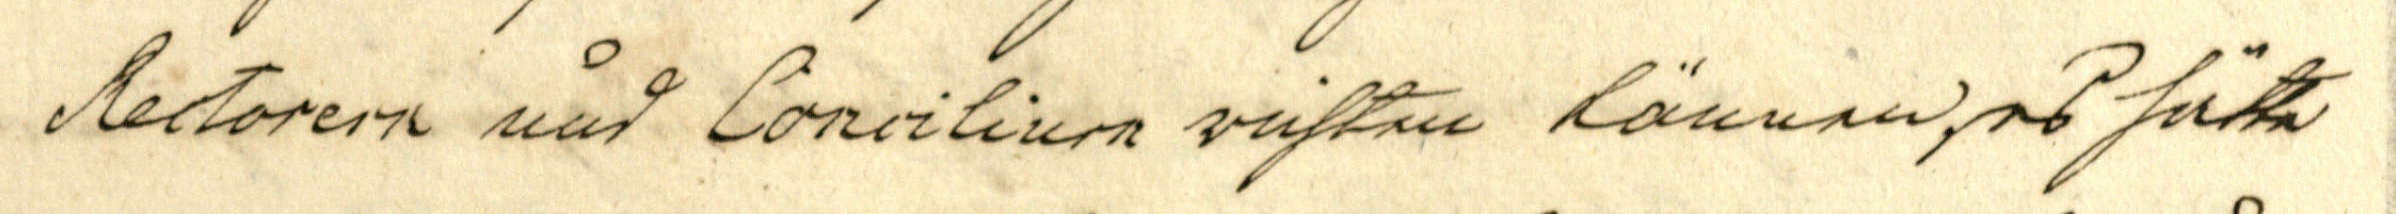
Rectorem und Concilium richten können, es hätte
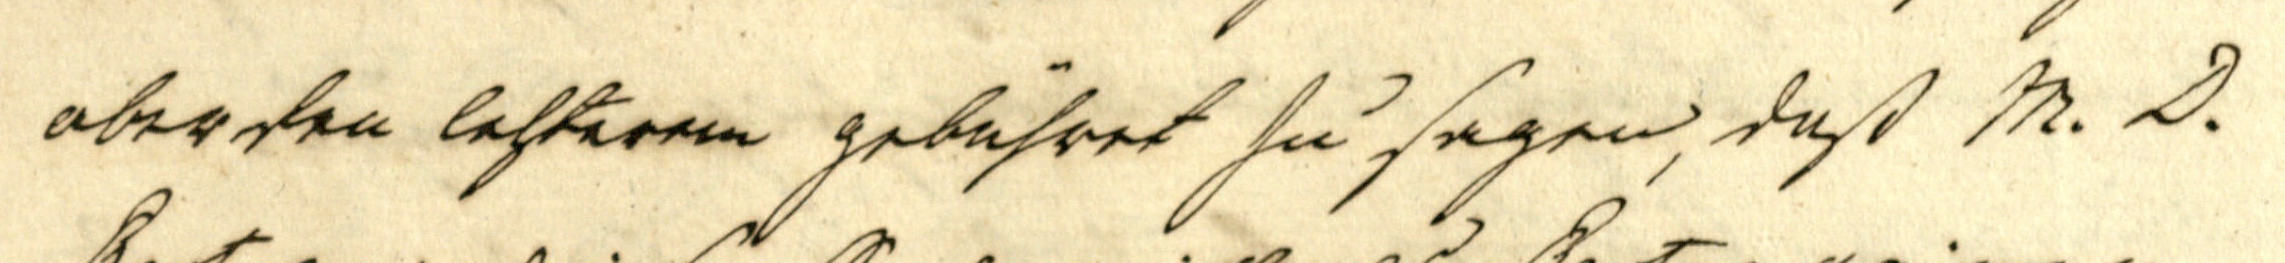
aber den letzterem gebühret zu sagen, daß M. D.
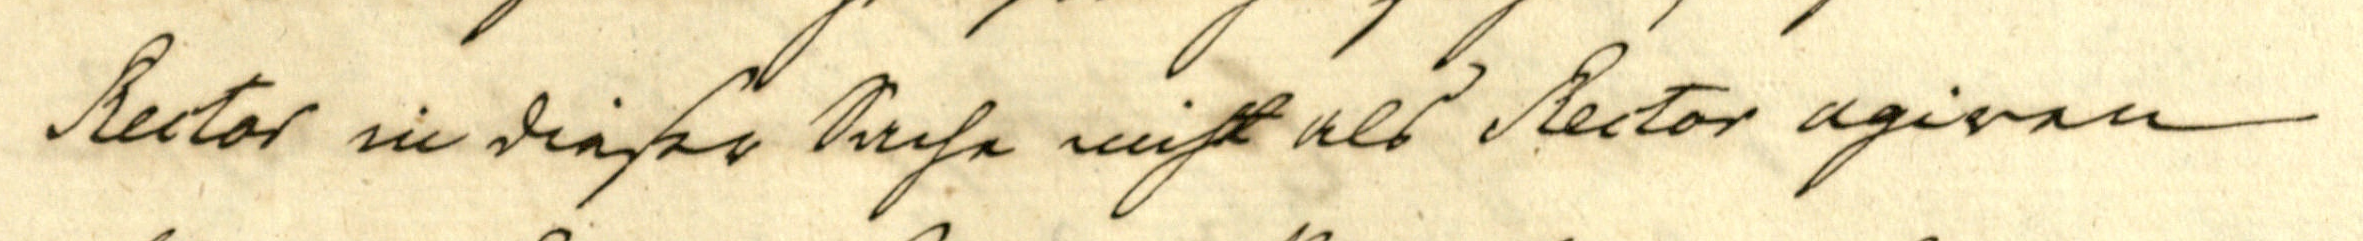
Rector in dieser Sache nicht als Rector agiren
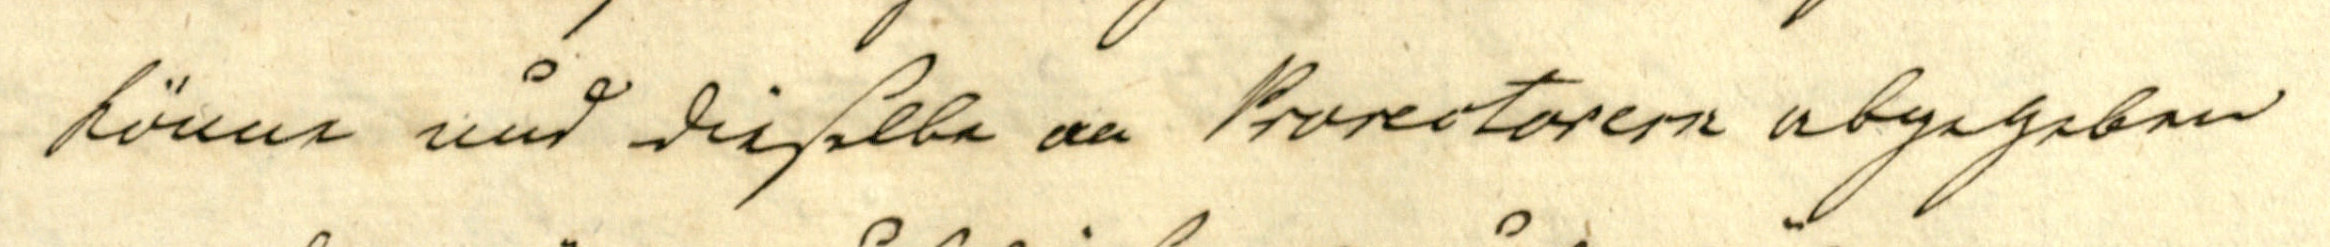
könne und dieselbe an Prorectorem abgegeben
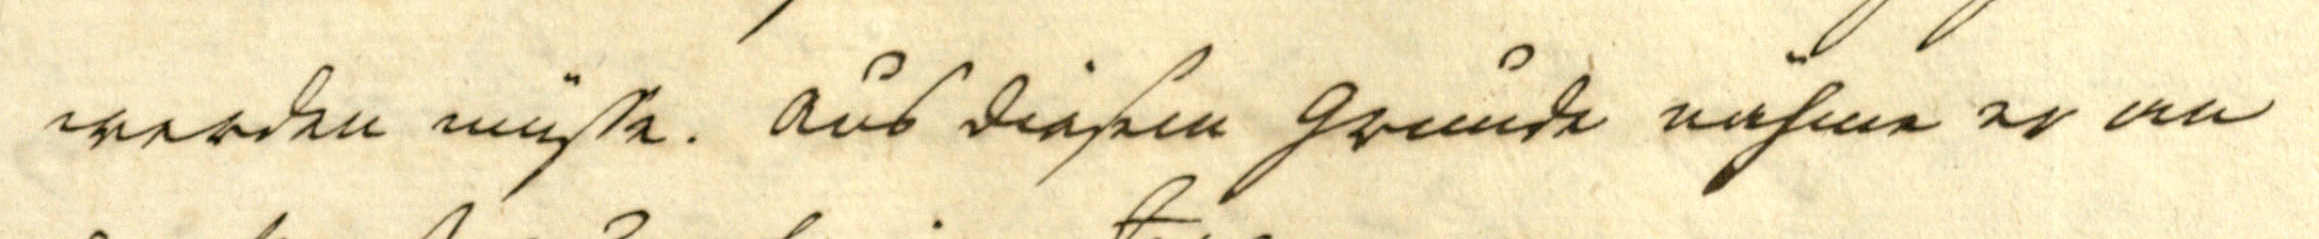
werden müsse. Aus diesem Grunde nähme er an
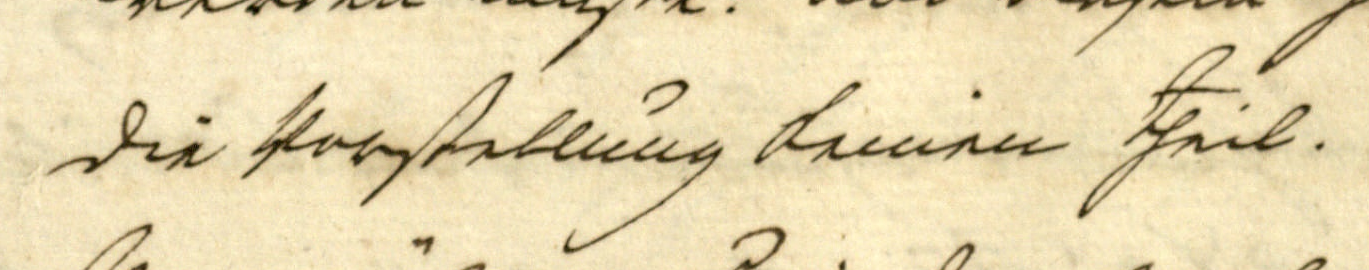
die Vorstellung keinen Theil.
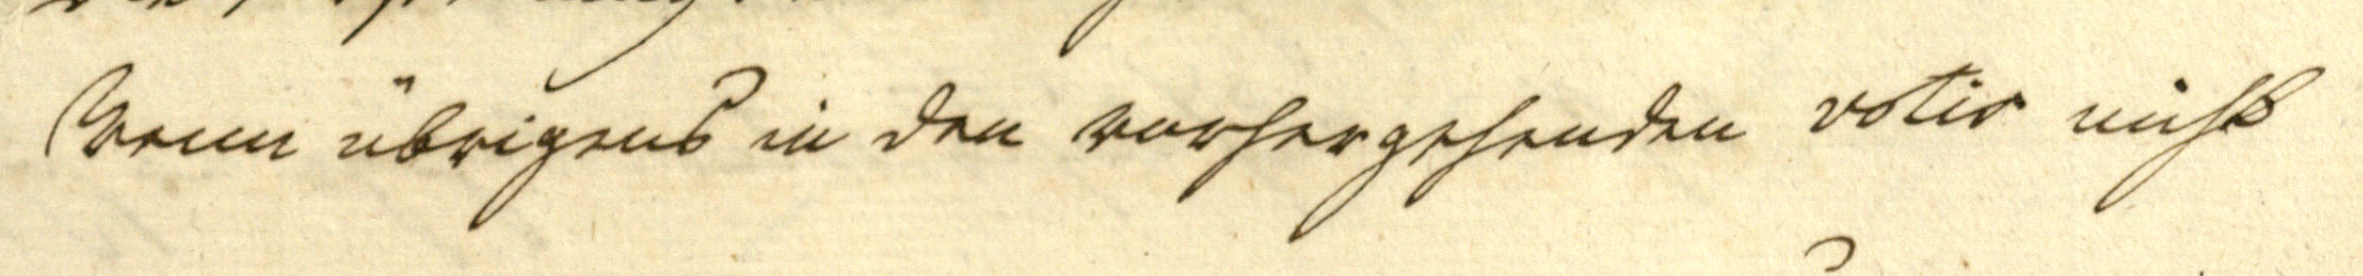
Wenn übrigens in den vorhergehenden votis nicht
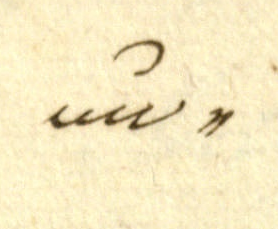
un
